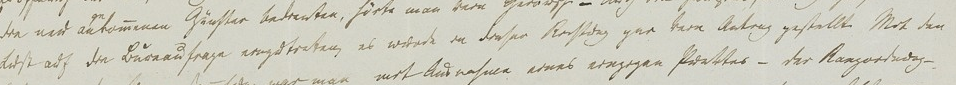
Lust auf die Büreaufrage einzutreten, es wurde in dieser Richtung gar kein Antrag gestellt. Mit den
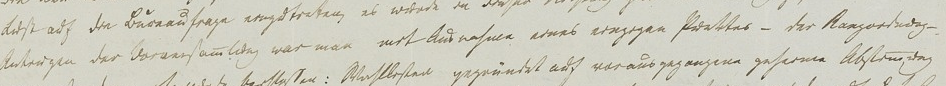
Anträgen der Vorversammlung war man mit Ausnahme eines einzigen Punktes – der Rangordnung –
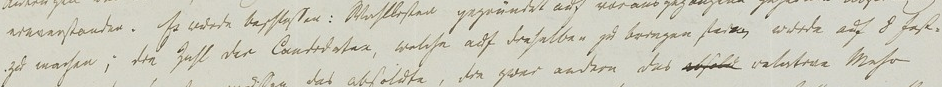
zu machen; die Zahl der Candidaten, welche auf dieselben zu bringen seien, wurde auf 8 fest-
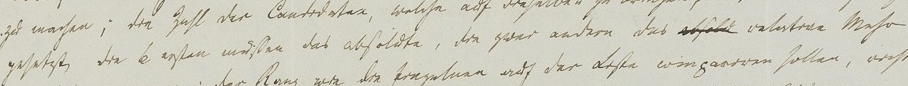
gesetzt, die 6 ersten müssen das absolute, die zwei andern das absolu relative Mehr
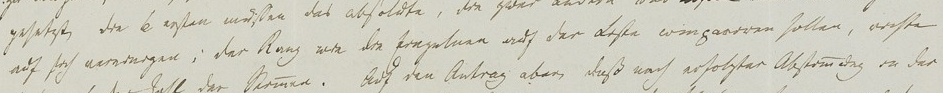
auf sich vereinigen; der Rang wie die Einzelnen auf der Liste compariren sollen, richte
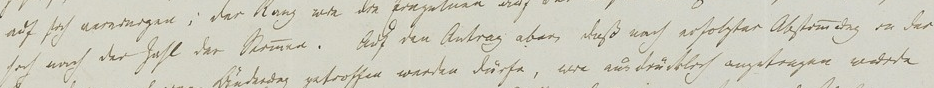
sich nach der Zahl der Stimmen. Auf den Antrag aber, daß nach erfolgter Abstimmung in der
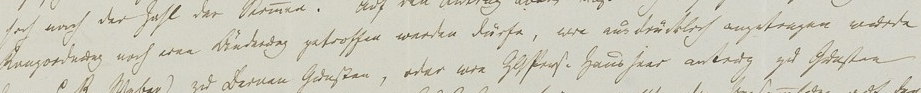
Rangordnung noch eine Änderung getroffen werden dürfe, wie ausdrücklich angetragen wurde
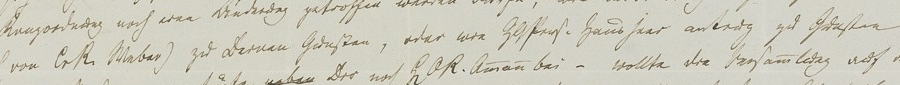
(von Cr.R. Weber) zu Deinen Gunsten, oder wie ZGPräs. Hausheer antrug zu Gunsten
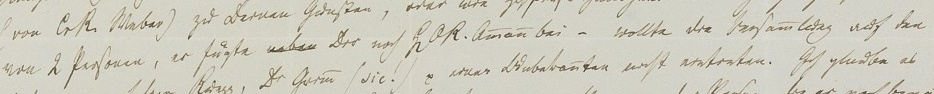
von 2 Personen, er fügte Dir noch Hr OR. Ammann bei – wollte die Versammlung auf den
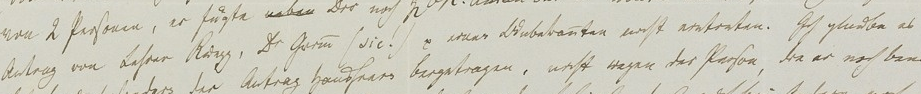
Antrag von Lehrer Rüegg, DrGrimm (sic!) & eines Unbekannten nicht eintreten. Ich glaube es
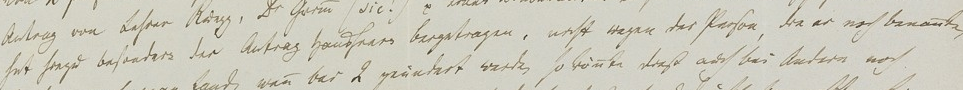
hat hiezu besonders der Antrag Hausheers beigetragen, nicht wegen der Person, die er noch benannte,
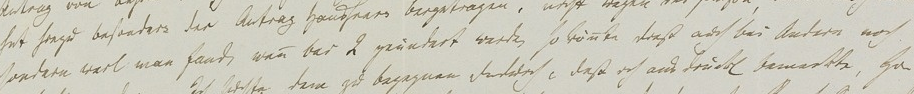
sondern weil man fand, wenn bei 2 geändert werde, so könnte dieß auch bei Andern noch
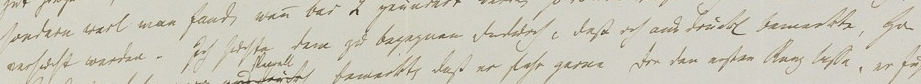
versucht werden. Ich suchte dem zu begenen dadurch, daß ich ausdrücklich bemerkte, Hr.
